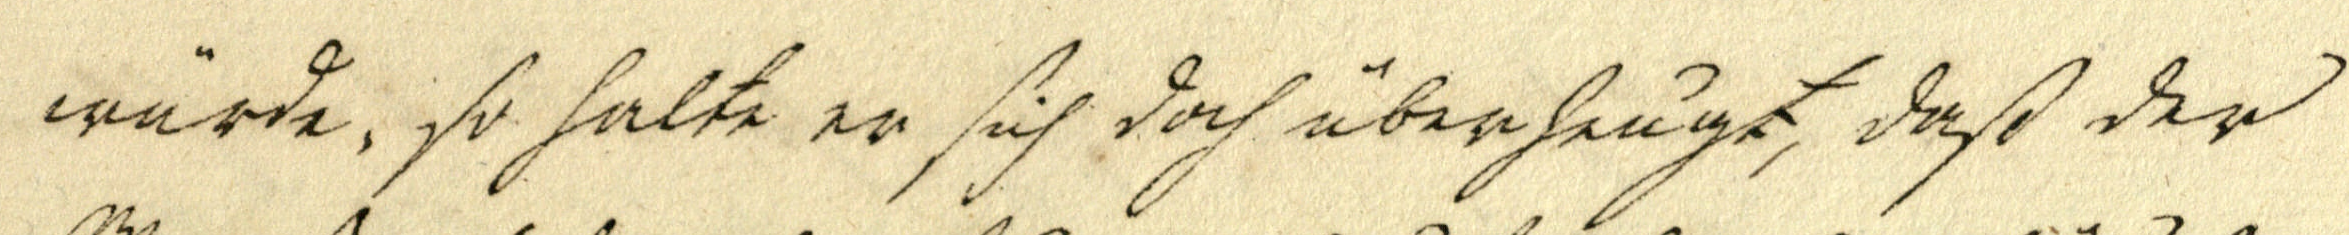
würde, so halte er sich doch überhaupt, daß der
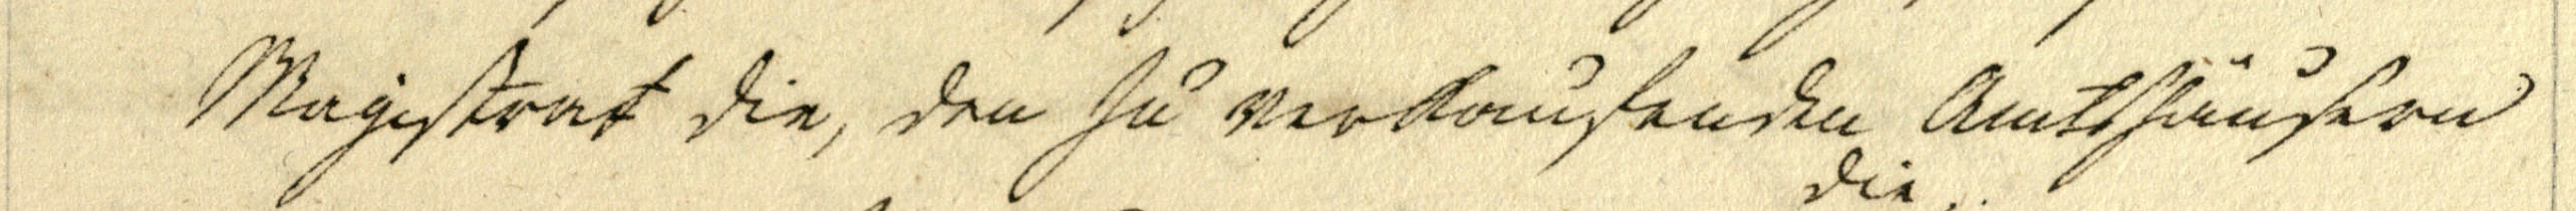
Magistrat die, den zu verkaufenden Amtshäusern
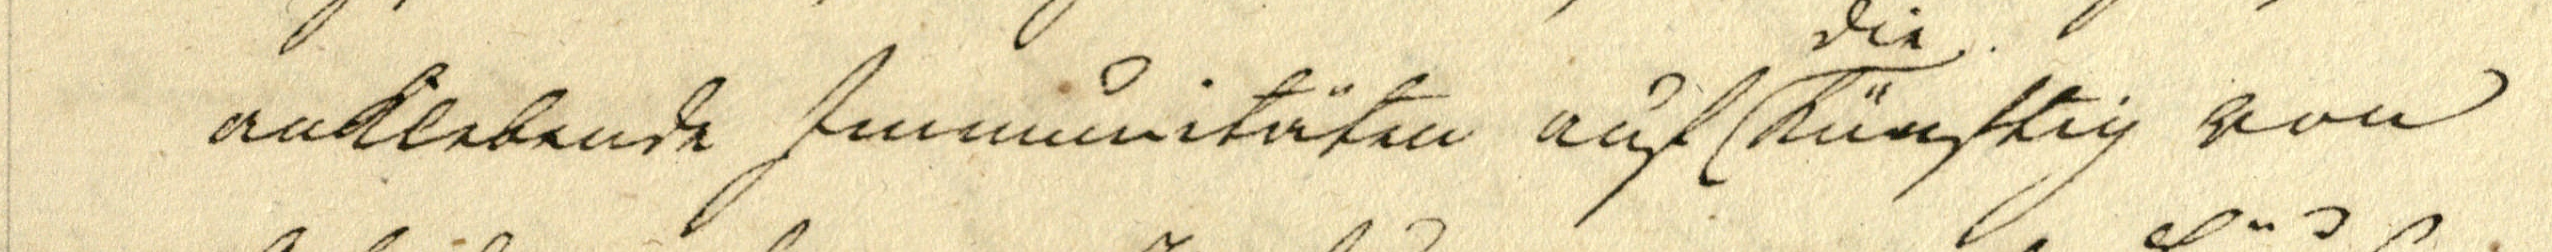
anklebende Immunitäten auf die künftig von
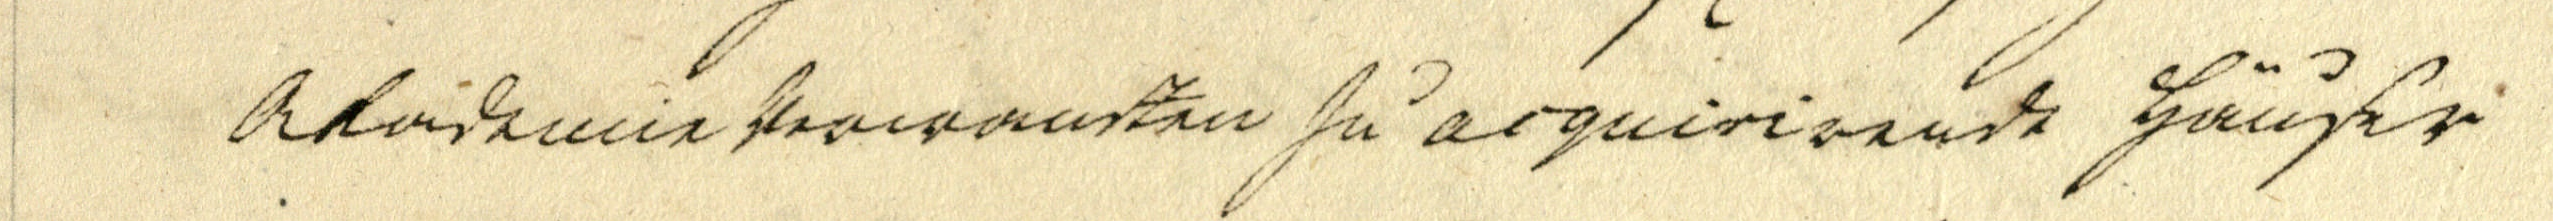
Akademie Verwandten zu acquirirende Häuser
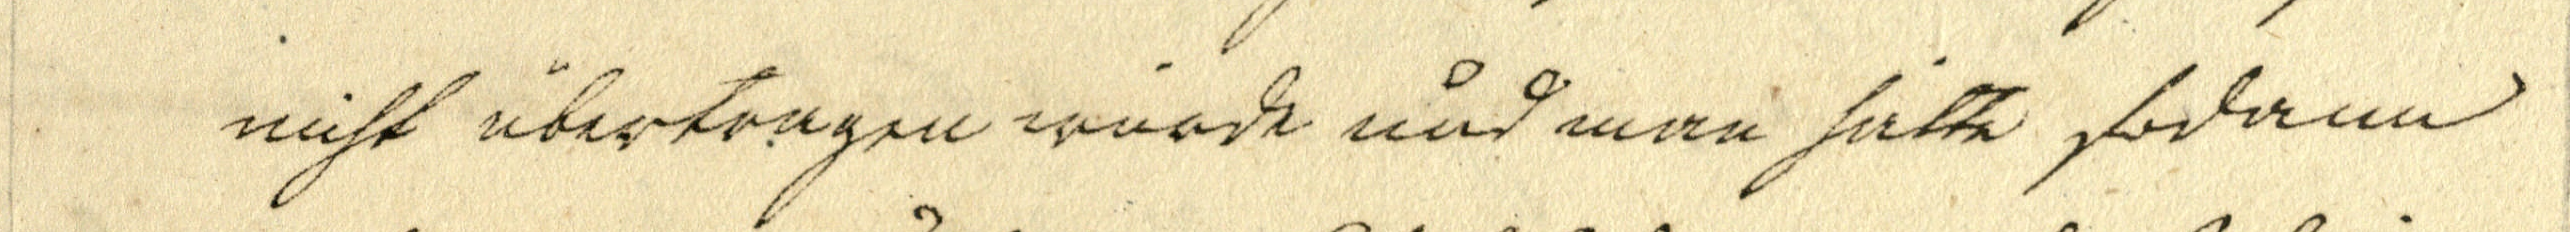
nicht übertragen würde und man hätte sodann
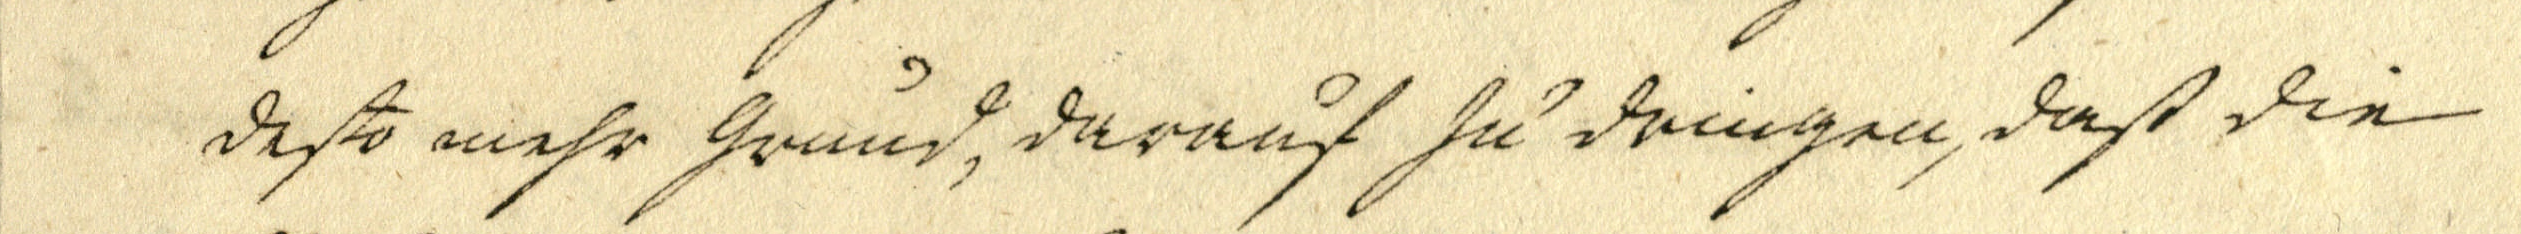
desto mehr Grund, darauf zu dringen, daß die
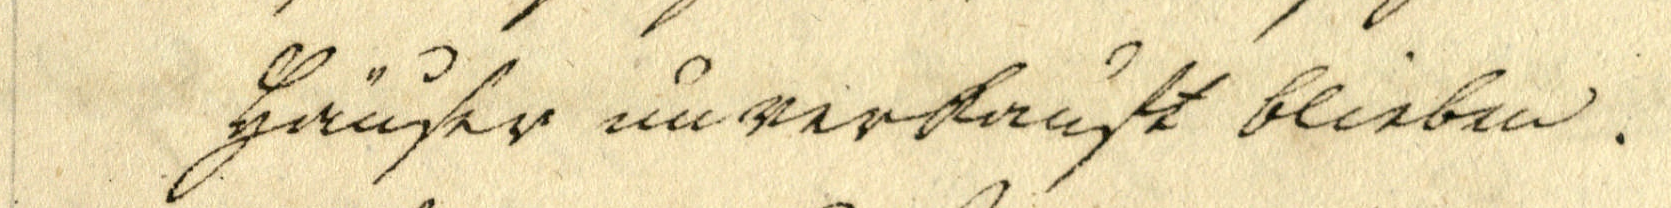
Häuser unverkauft blieben.
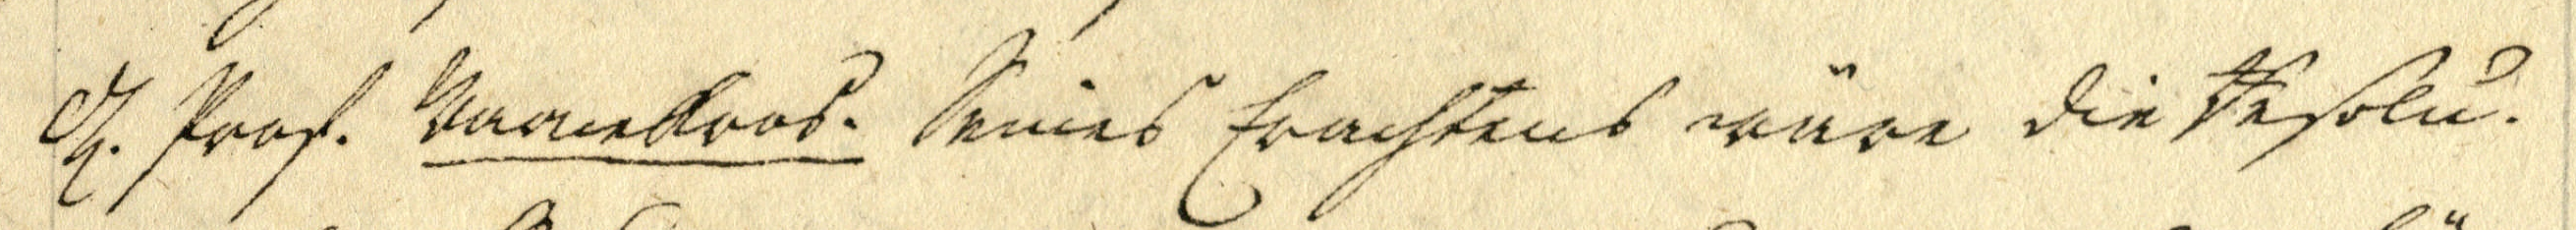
dh. Prof. Warnekros. Seines Erachtens wäre die Resolu¬
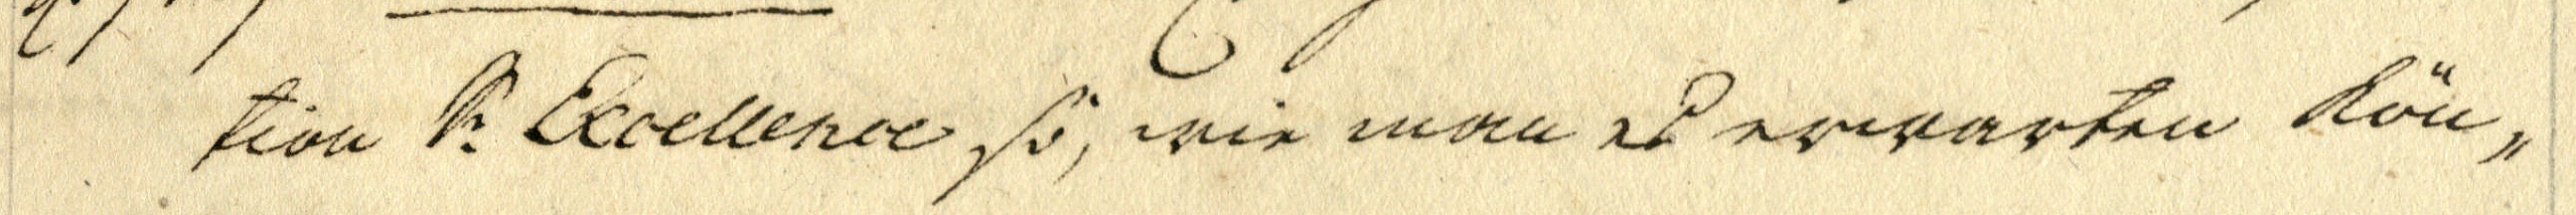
tion Sr. Excellence so, wie man es erwarten kön¬
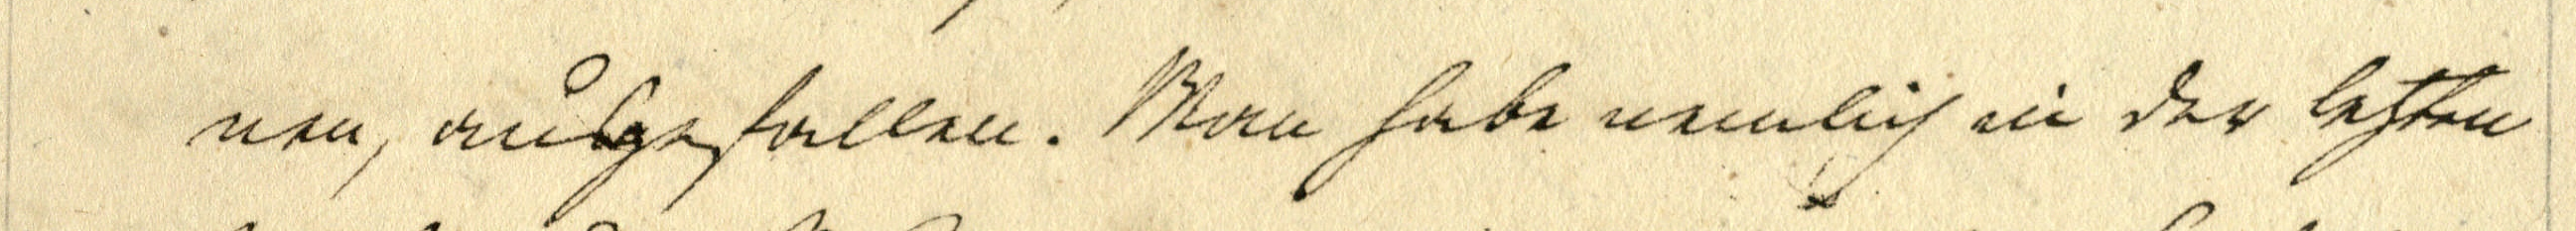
nen, ausgefallen. Man habe nemlich in der letzten
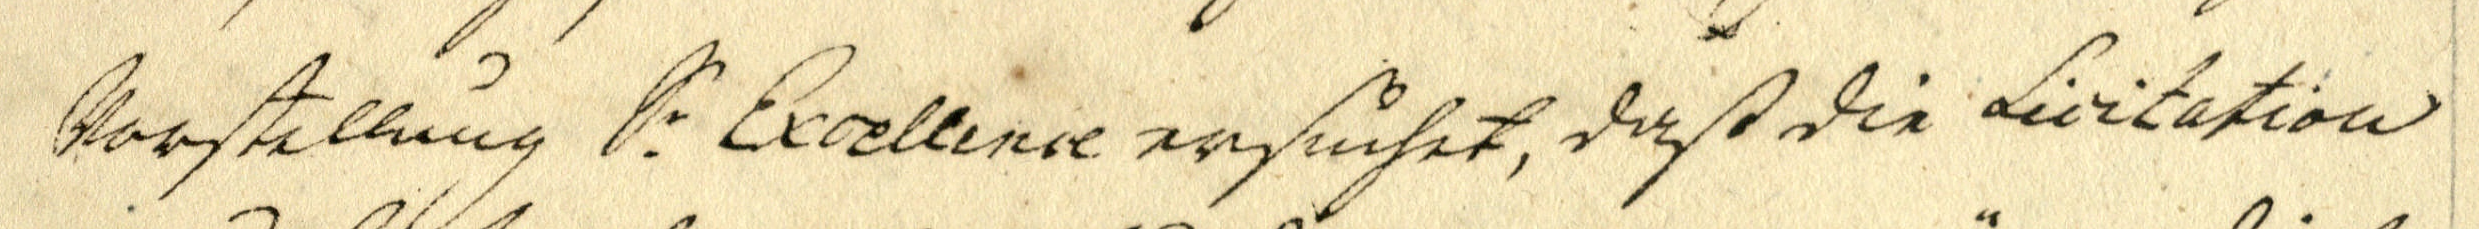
Vorstellung Sr. Excellence ersuchet, daß die Licitation
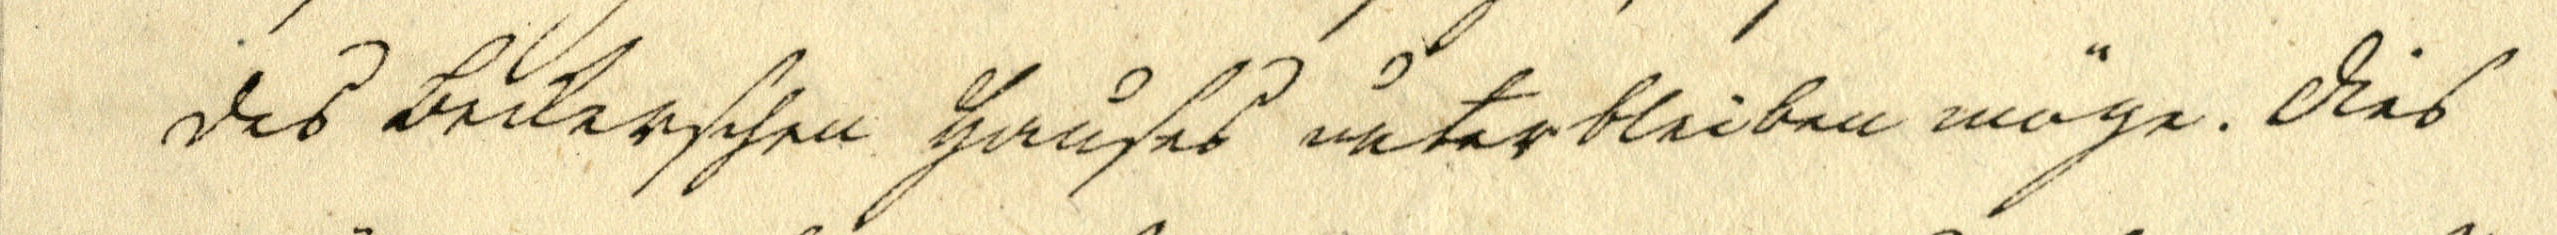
des Beckerschen Hauses unterbleiben möge. Dies
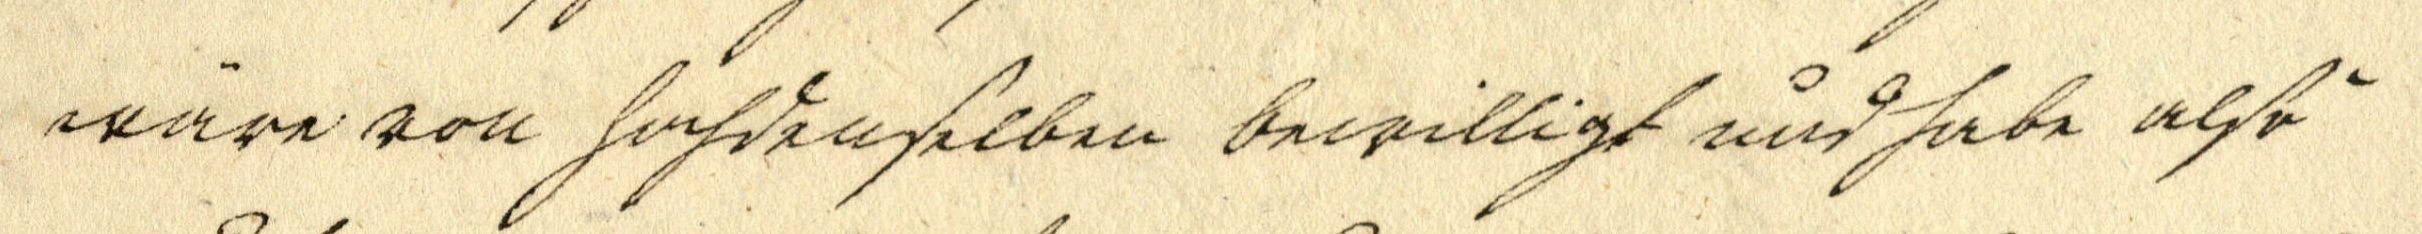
wäre von hochdenselben bewilligt und habe also
